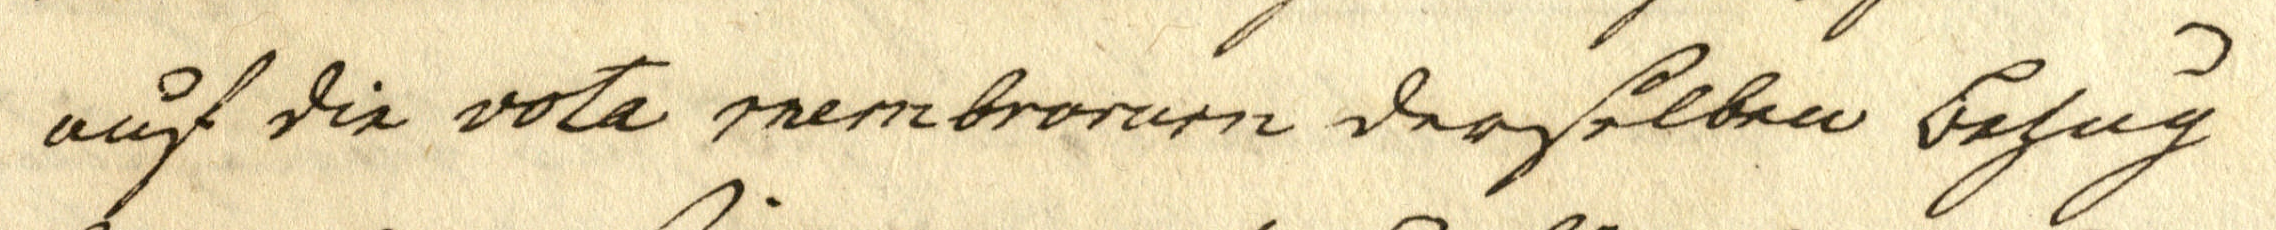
auf die vota membrorum derselben Bezug
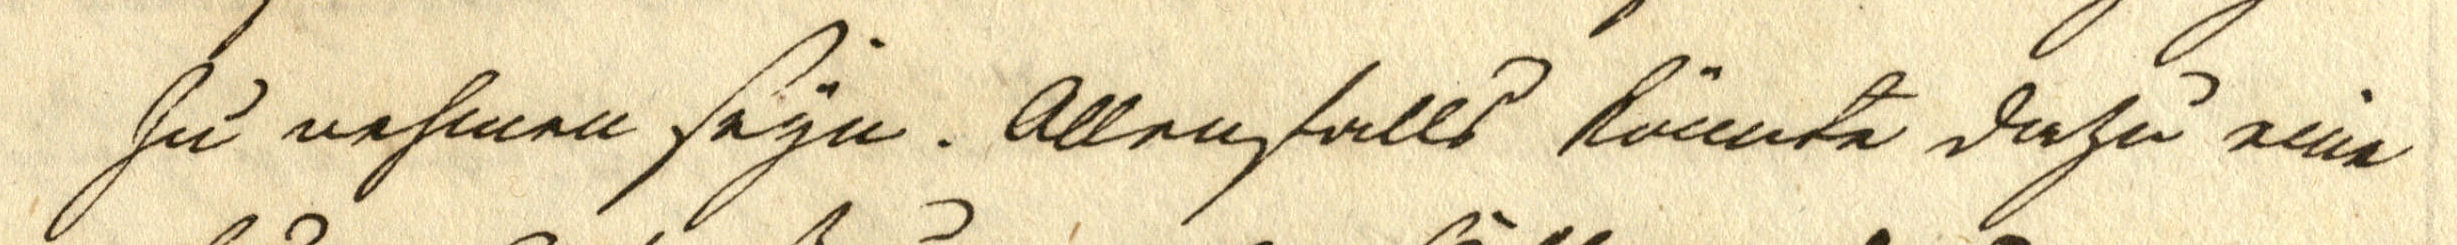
zu nehmen seyn. Allenfalls könnte dazu eine
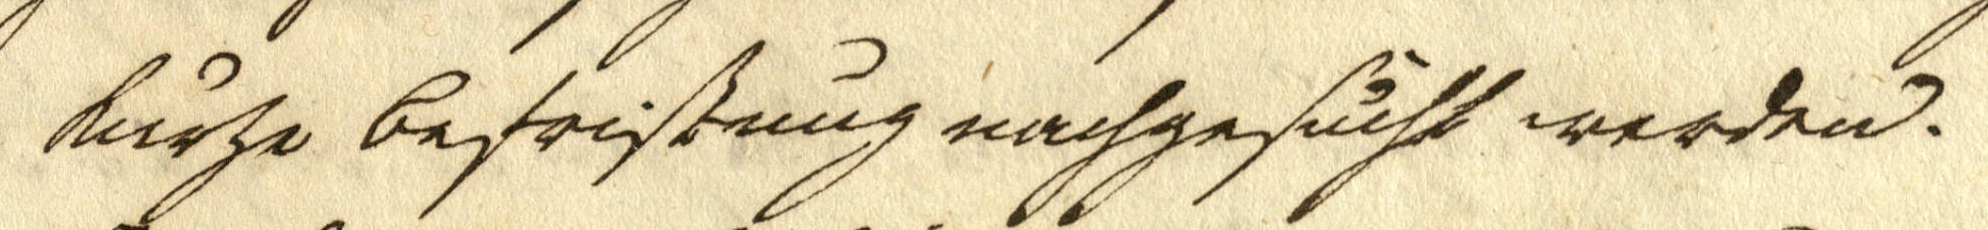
kurze Befristung nachgesucht werden.
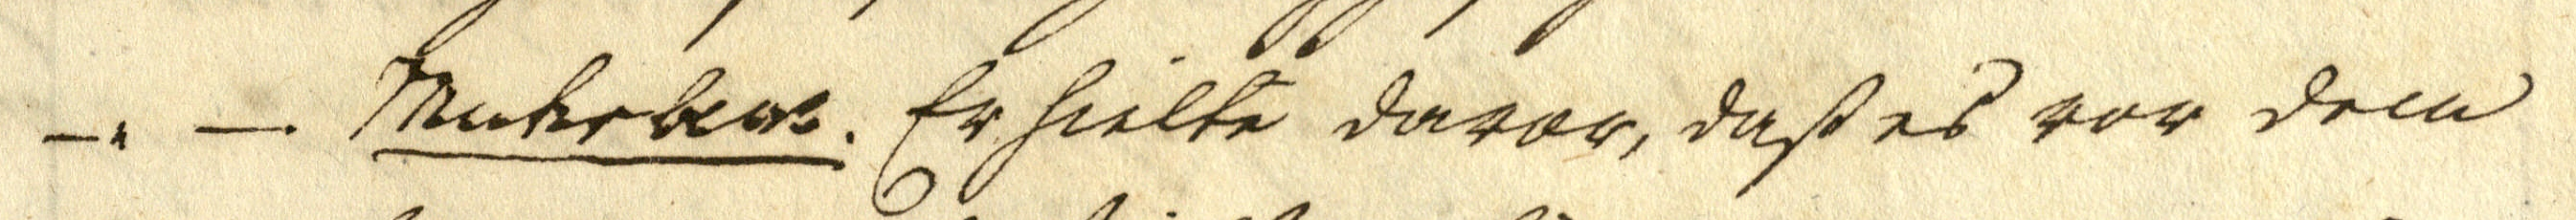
- " - Muhrbeck. er hielte davor, daß es vor dem
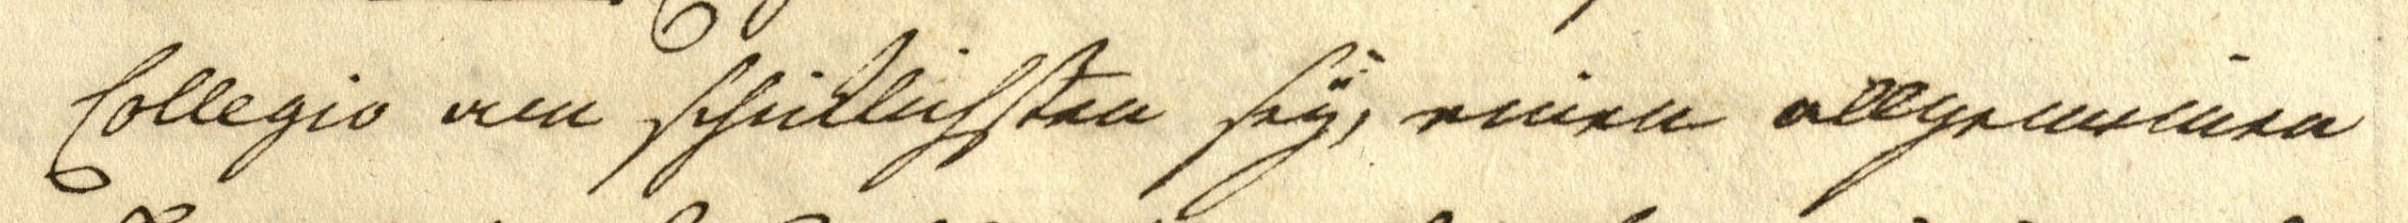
Collegio am schicklichsten sey, einen allgemeinen
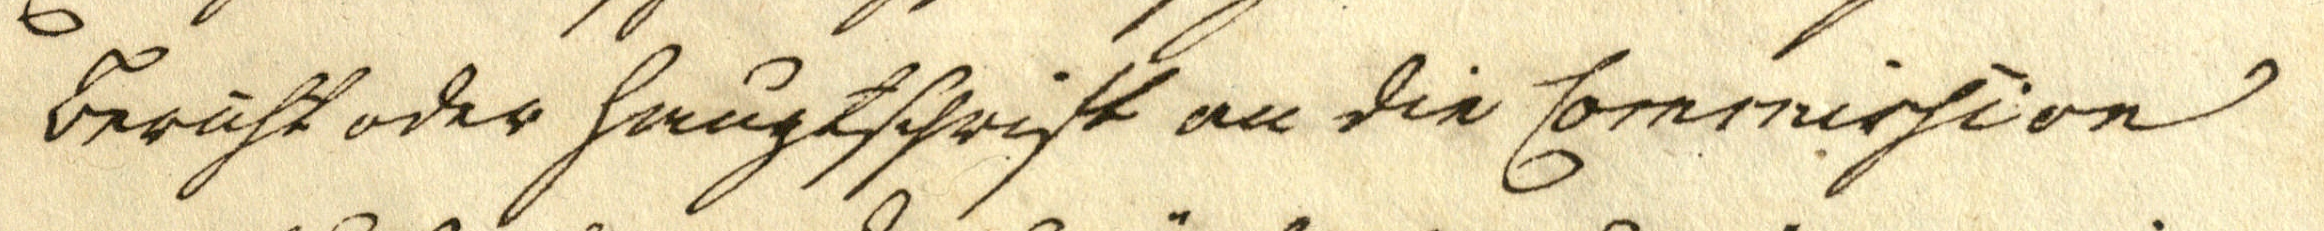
Bericht oder Hauptschrift an die Commission
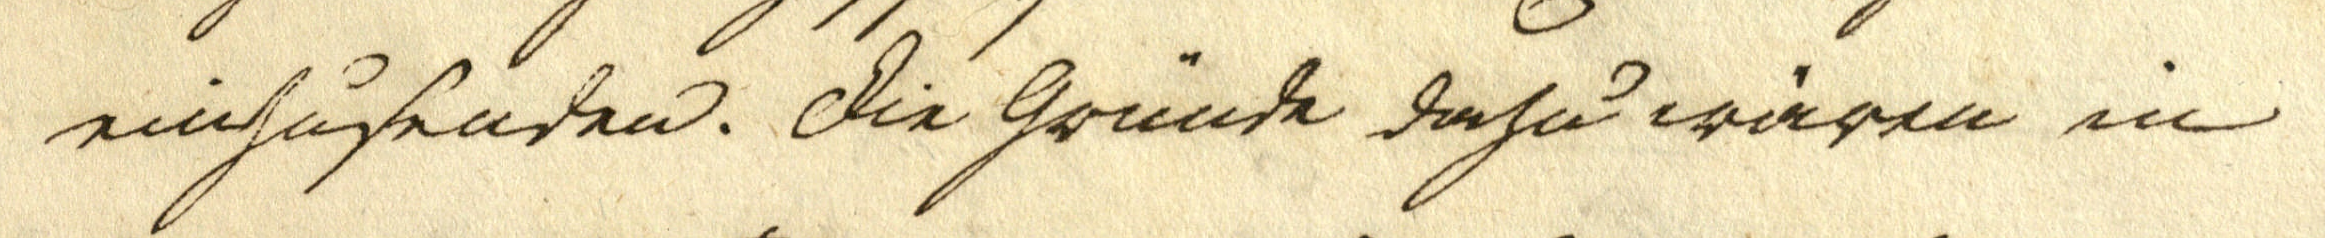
einzusenden. Die Gründe dazu wären in
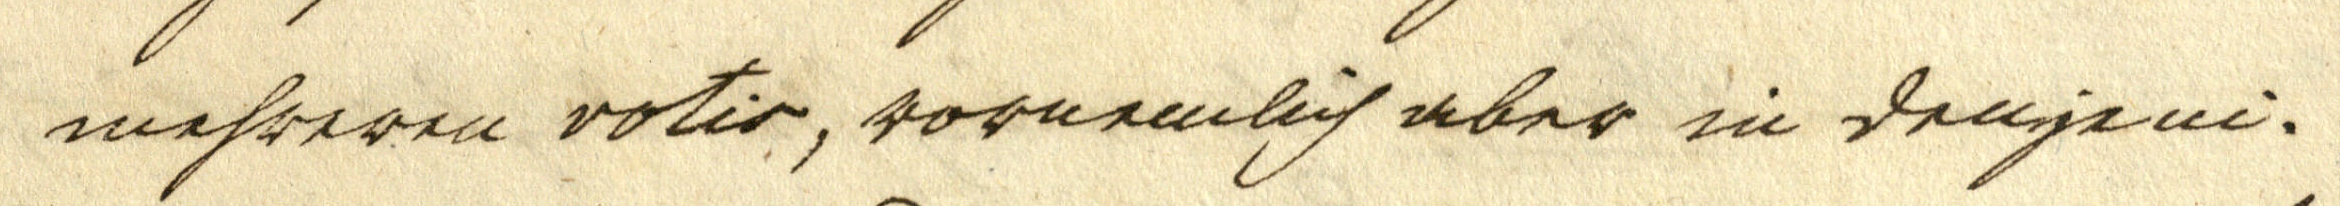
mehreren votis, vornemlich aber in denjeni-
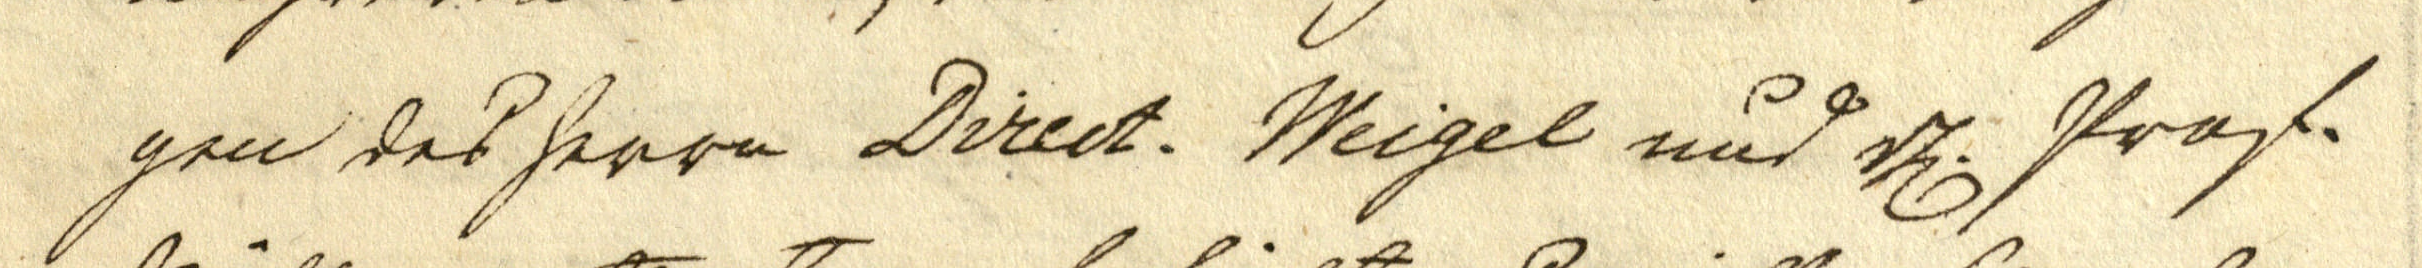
gen des Herrn Direct. Weigel und dh. Prof.
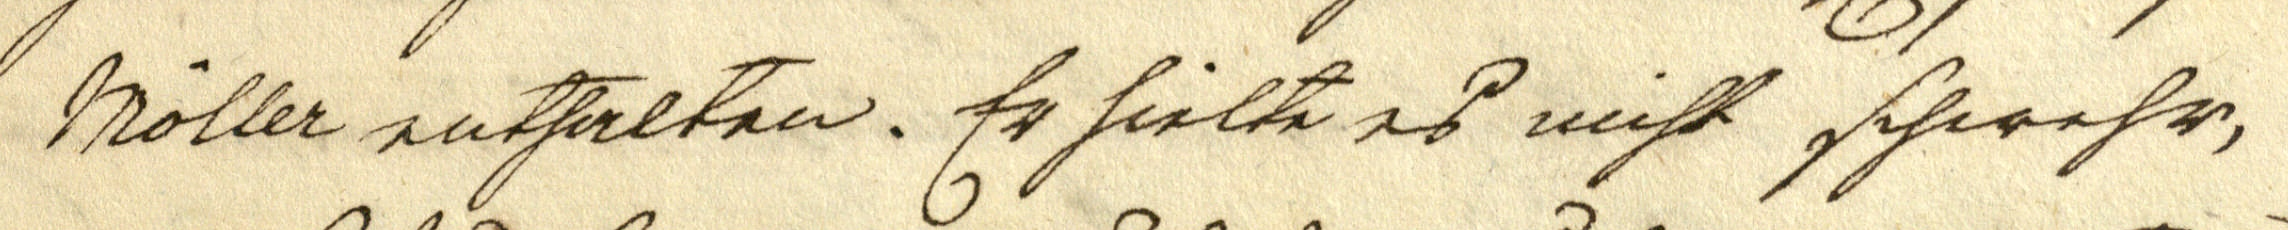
Möller enthalten. Er hielte es nicht schwehr,
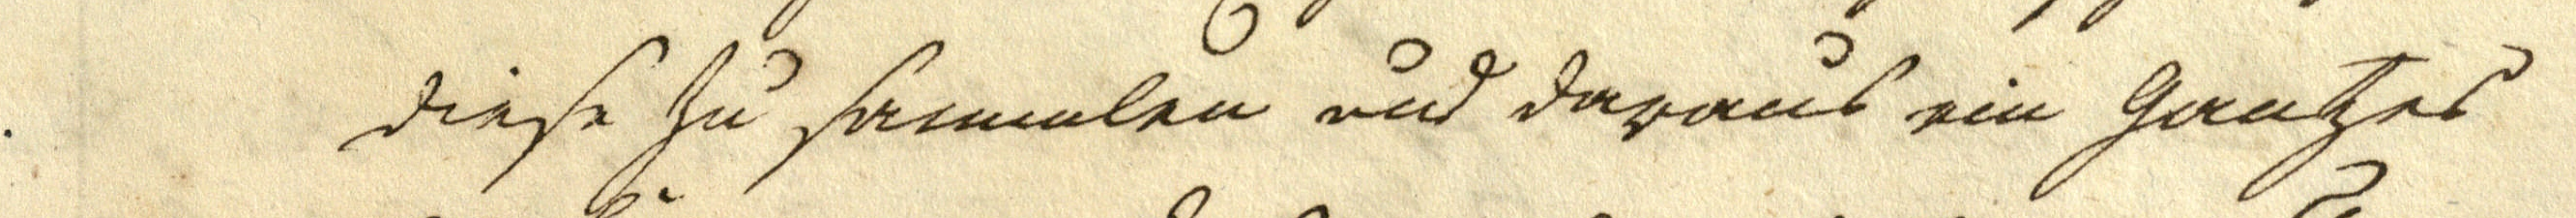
diese zu sammlen und daraus ein Gantzes
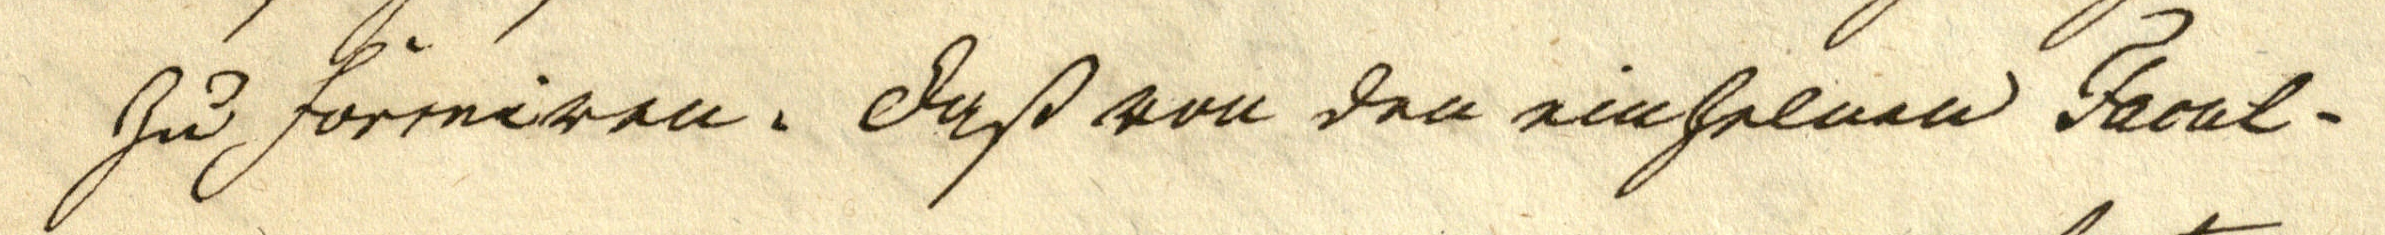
zu formiren. Daß von den einzelnen Facul-
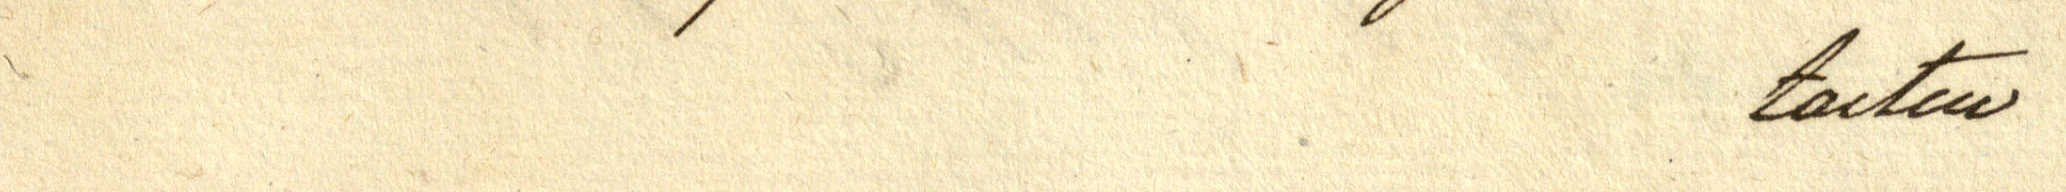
taeten
